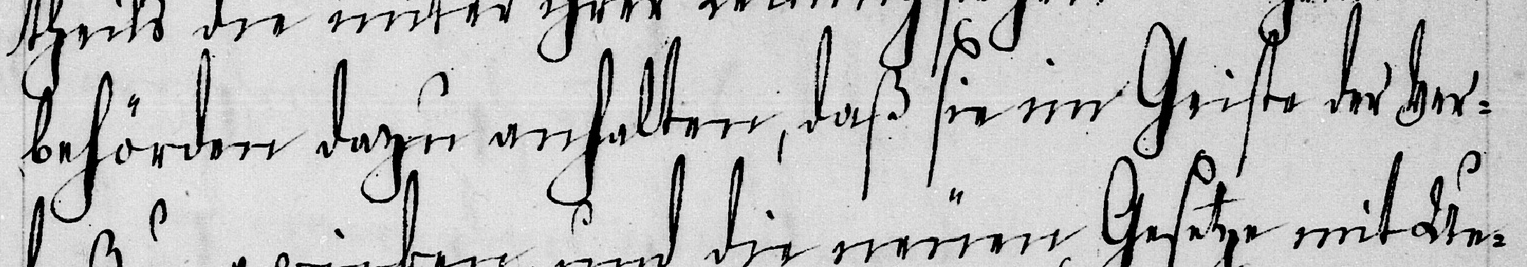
behörden dazu anhalten, daß sie im Geiste der Ver¬
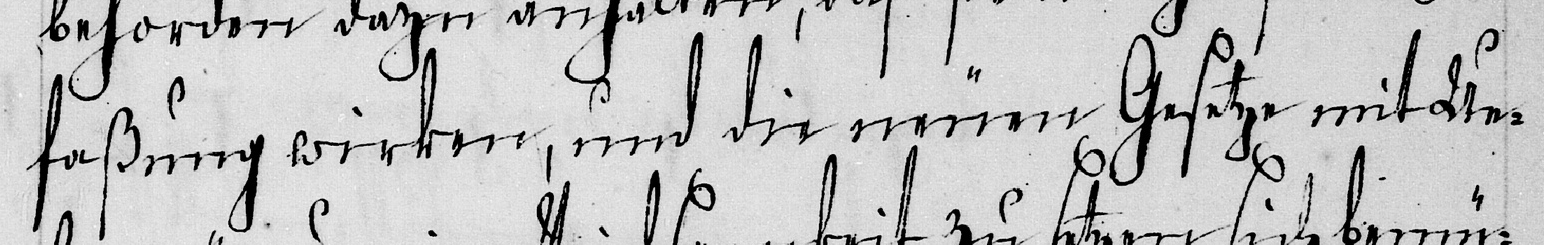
faßung wirken, und die neuen Gesetze mit Ue¬
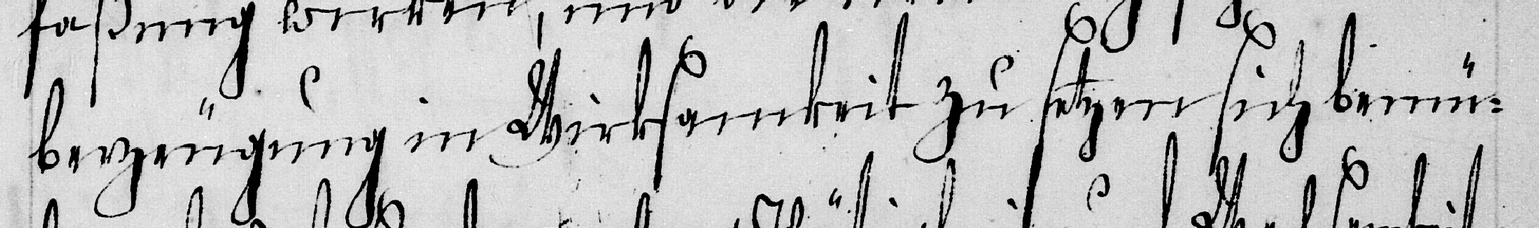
berzeugung in Wirksamkeit zu setzen sich bemü¬
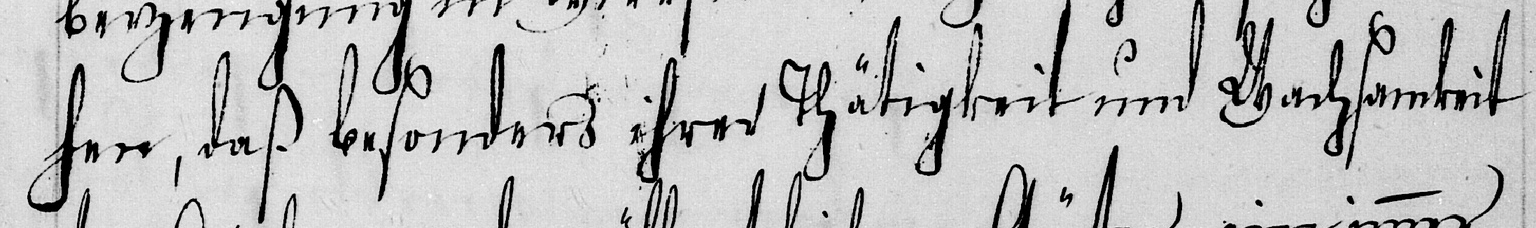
hen, daß besonders ihrer Thätigkeit und Wachsamkeit
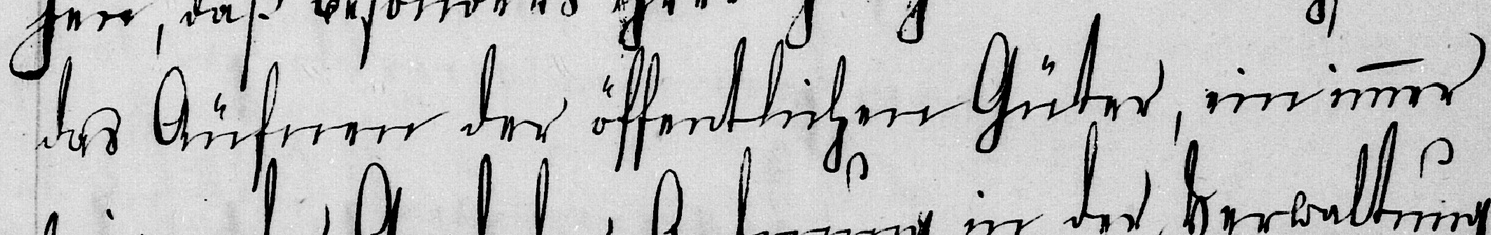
das Äufnen der öffentlichen Güter, ein immer
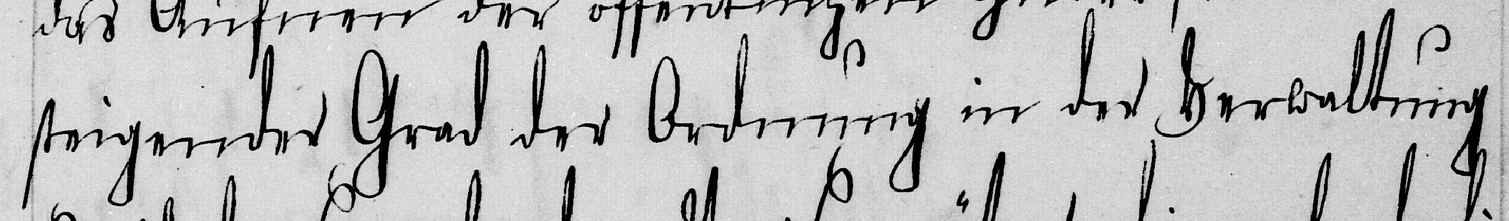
steigender Grad der Ordnung in der Verwaltung
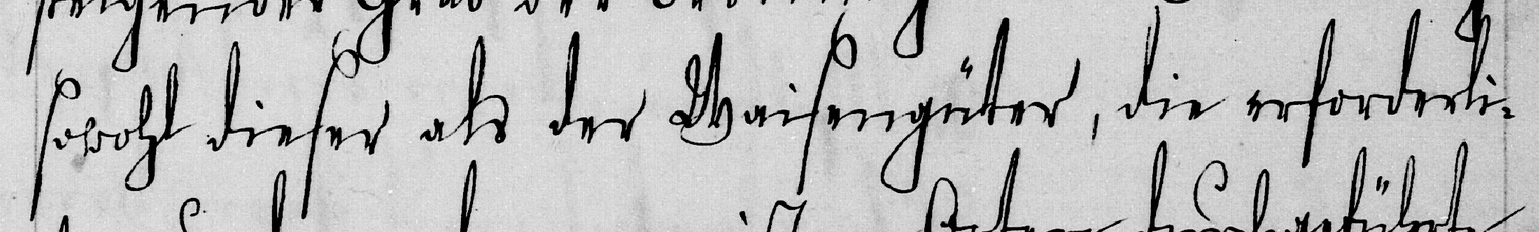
sowohl dieser als der Waisengüter, die erfoderli¬
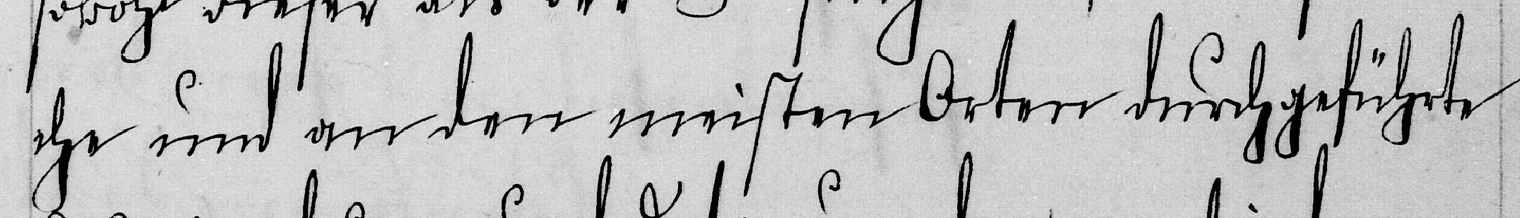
che und an den meisten Orten durchgeführte
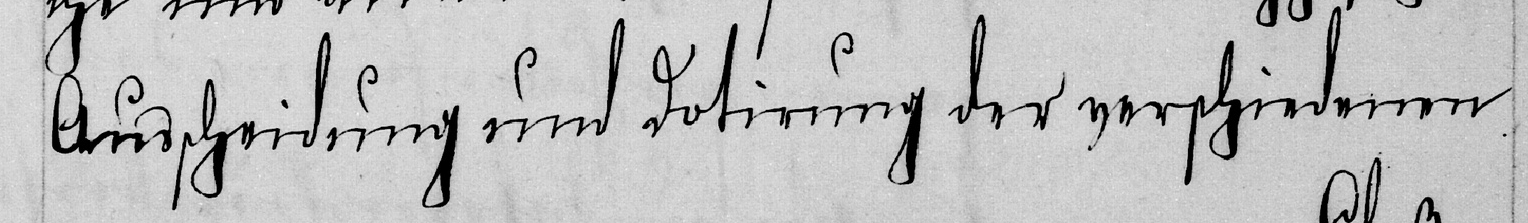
Ausscheidung und Dotirung der verschiedenen
